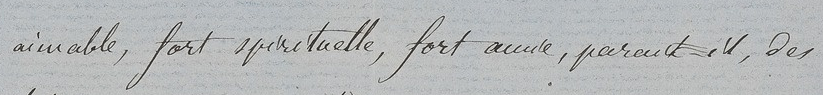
aimable, fort spirituelle, fort amie, parait-il, des
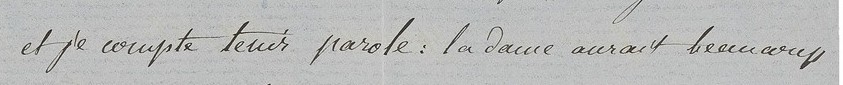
et je compte tenir parole: la dame aurait beaucoup
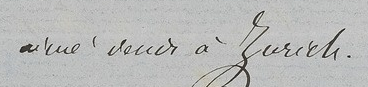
aimé venir à Zurich.
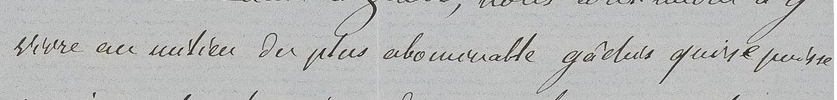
vivre au milieu du plus abominable gâchis qui se puisse
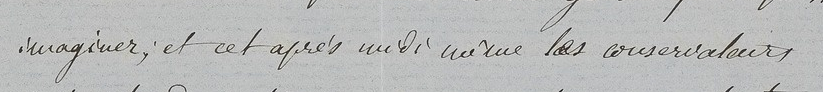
imaginer; et cet après midi même les conservateurs
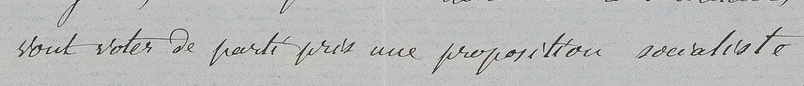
vont voter de parti pris une proposition socialiste
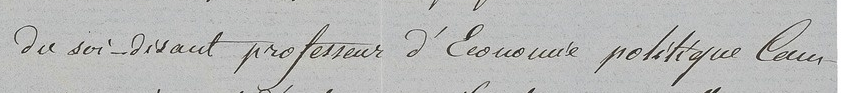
du soi-disant professeur d'Economie politique Com-
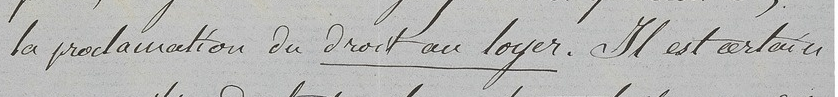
la proclamation du droit au loyer. Il est certain
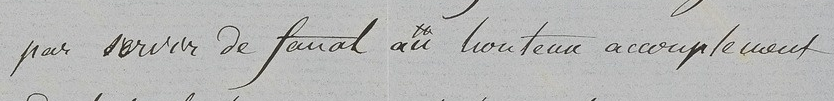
par servir de fanal au honteux accouplement
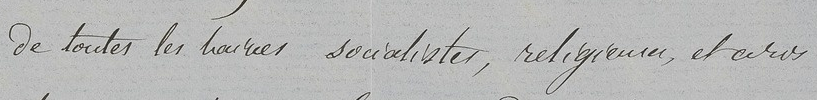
de toutes les haines socialistes, religieuses, et aris-
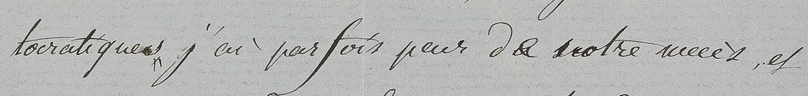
tocratiques j'ai parfois peur de notre succès, et
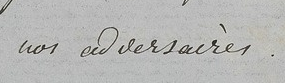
nos adversaires.
